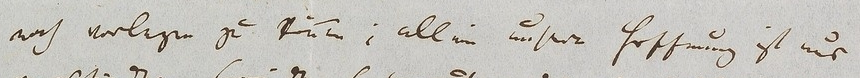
noch vorlegen zu können; allein unsere Hoffnung ist aus
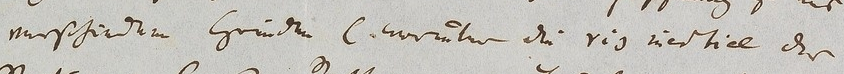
verschiednen Gründen (worunter die vis inertiae des
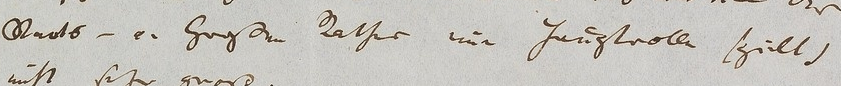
Staats- &. Großen Rathes eine Hauptrolle spielt)
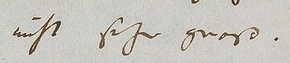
nicht sehr groß.
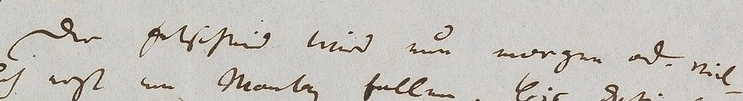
Der Entscheid wird nun morgen od. viel-
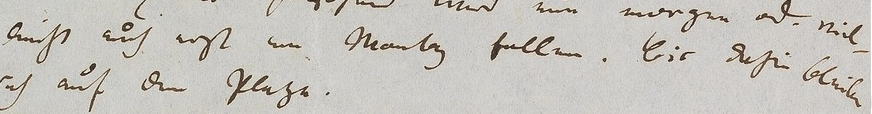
leicht auch erst am Montag fallen. Bis dahin bleibe
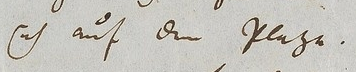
ich auf dem Platze.
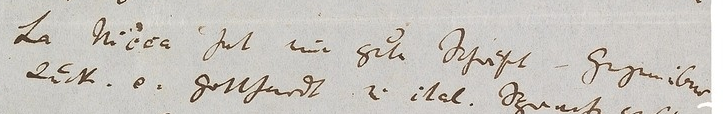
La Nicca hat eine gute Schrift – Gegenüber-
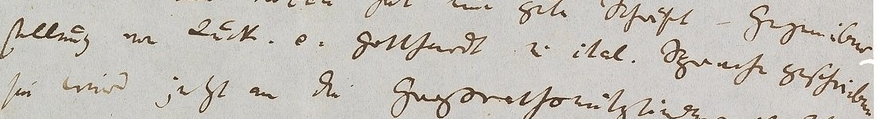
stellung von Luck. &. Gotthardt in ital. Sprache geschrieben,
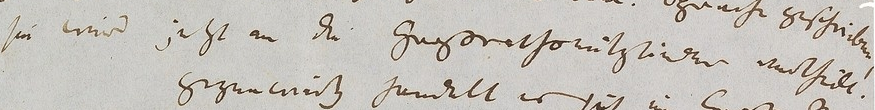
sie wird jetzt an die Großrathsmitglieder vertheilt.
